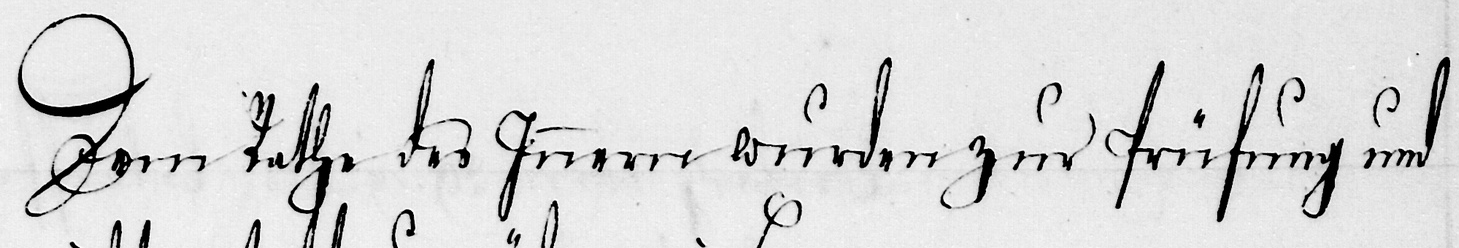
Dem Rathe des Innern wurden zur Prüfung und
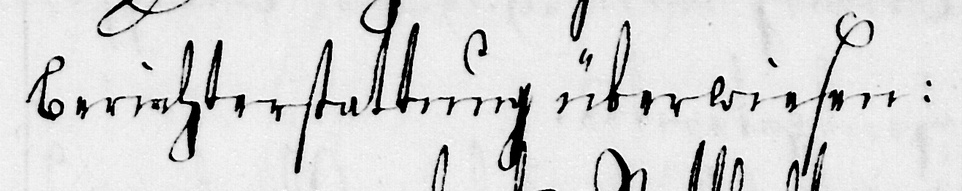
Berichterstattung überwiesen:
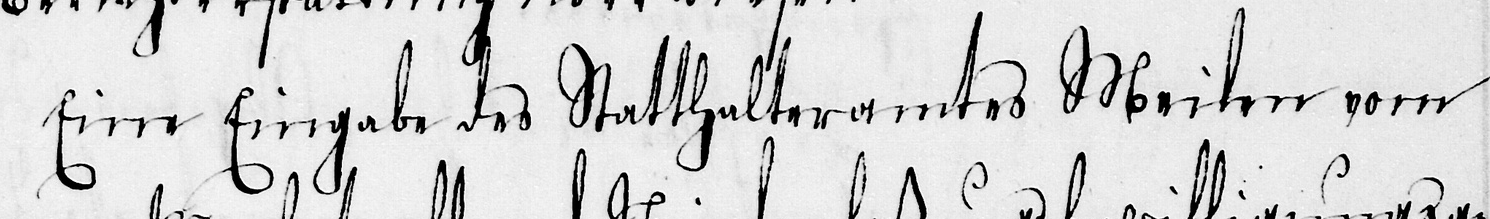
Eine Eingabe des Statthalteramtes Meilen vom
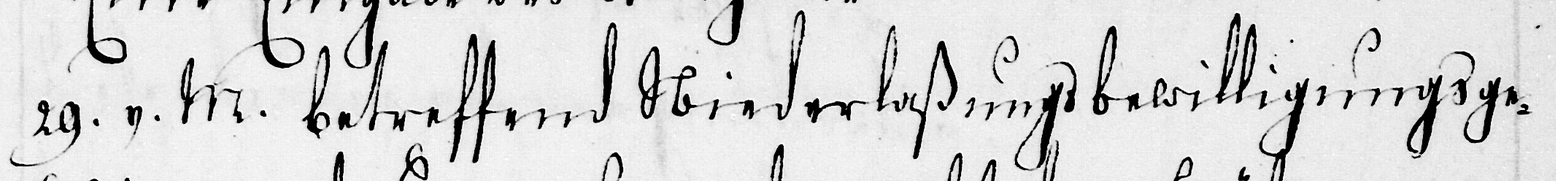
29. v. M. betreffend Niederlaßungsbewilligungsge¬
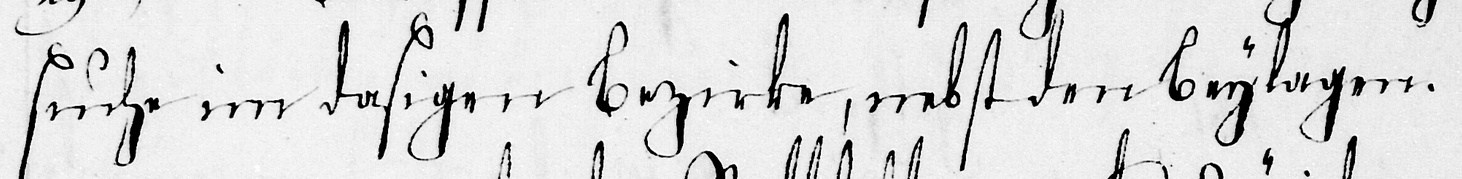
suche im dasigen Bezirke, nebst den Beylagen.
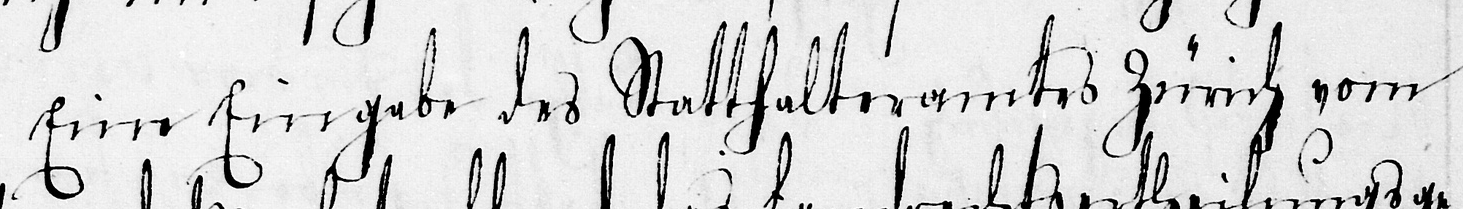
Eine Eingabe des Statthalteramtes Zürich vom
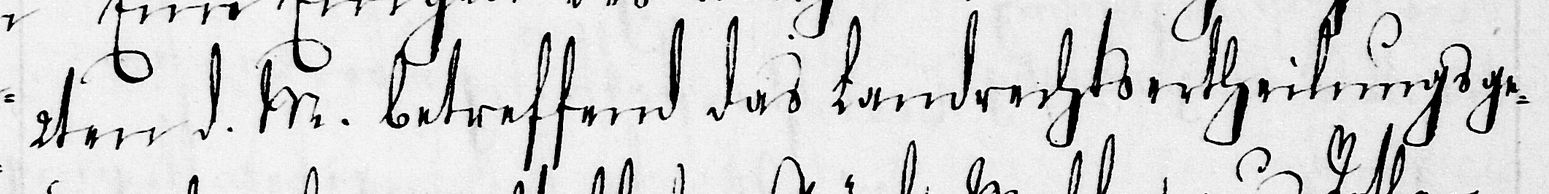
2ten d. M. betreffend das Landrechtsertheilungsge¬
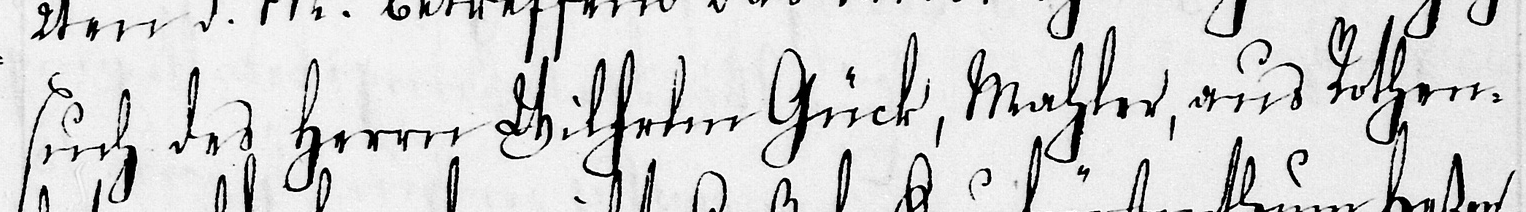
such des Herrn Wilhelm Gück, Mahler, aus Rothen¬
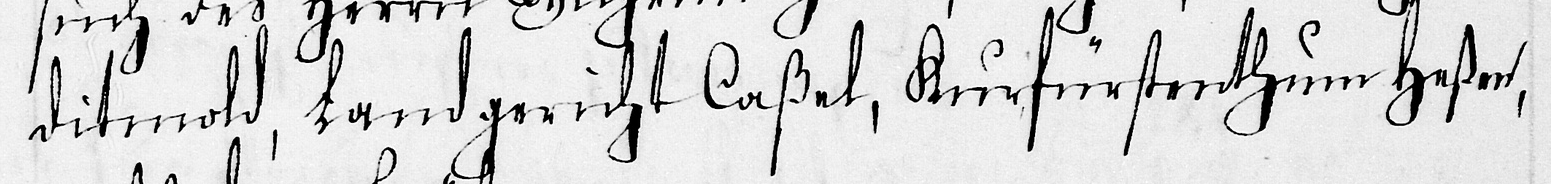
ditmold, Landgericht Caßel, Kurfürstenthum Heßen,
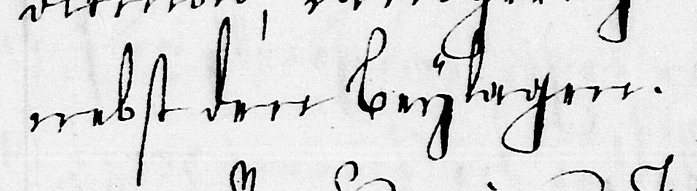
nebst den Beylagen.
